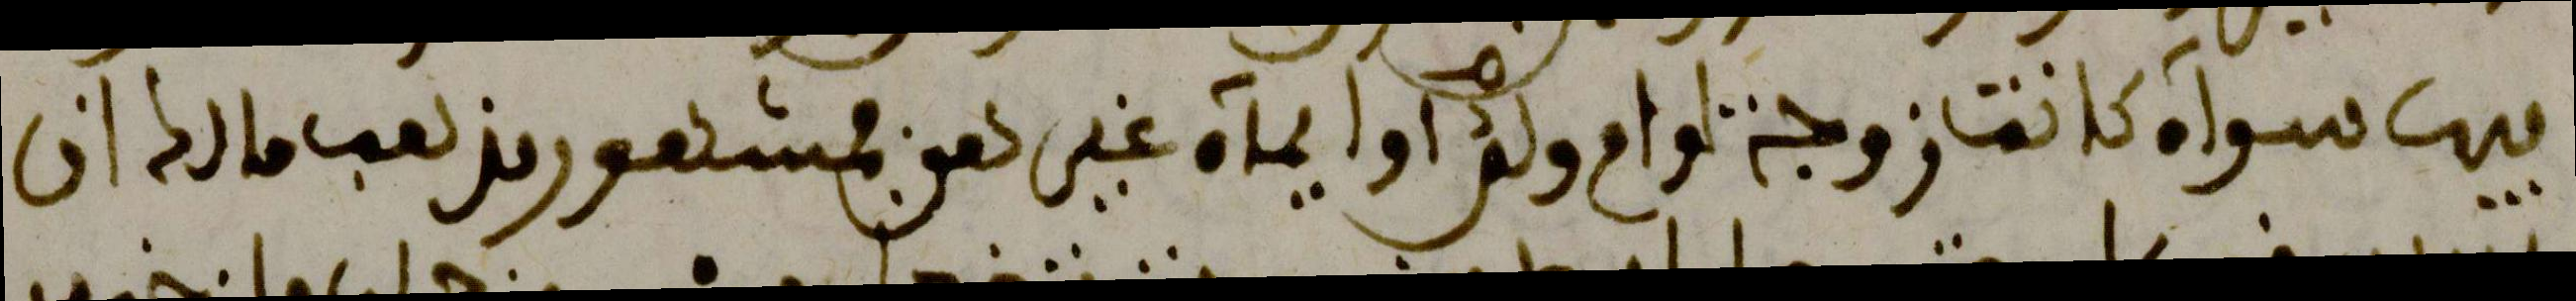فيها سواء كانت زوجة او ام ولد او ايماء غير هن فمشهور مذهب مالك ان
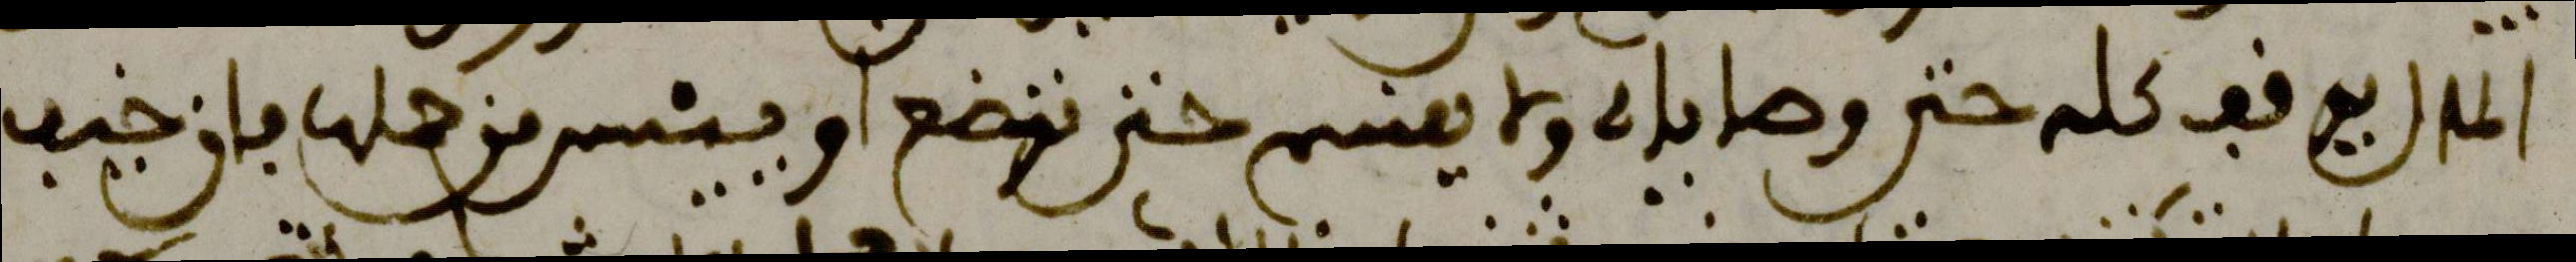المال يوقف كله حتى وصاياه و لا يقسم حتى تضع او ييئس من حملها فان خيف
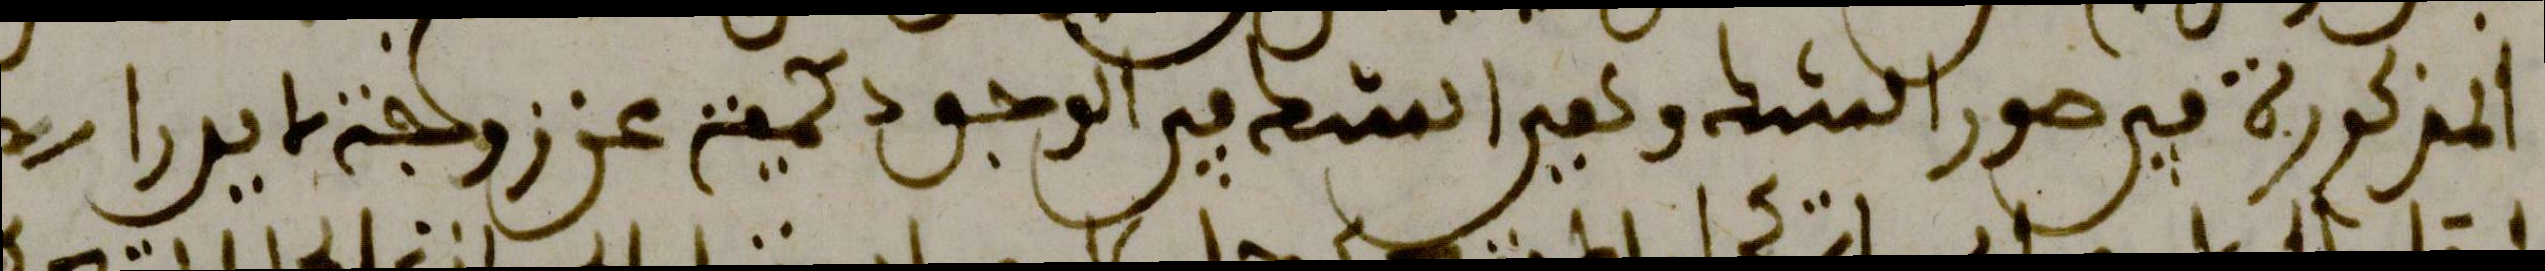المذكورة في صور الشك و هي الشك في الوجود كمية عن زوجة لا يدرا
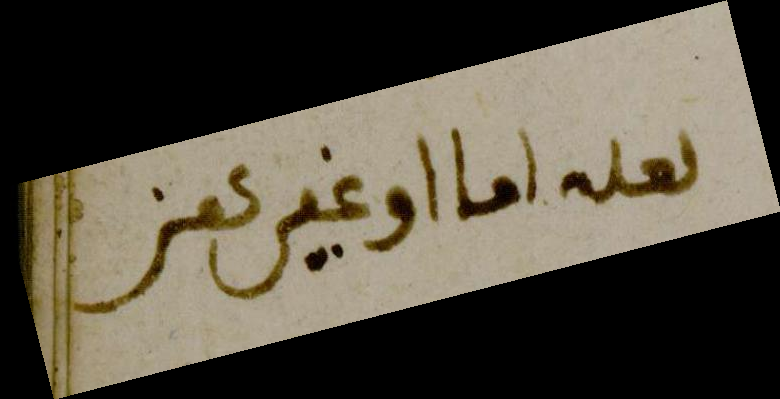لعله اما او غيرهن
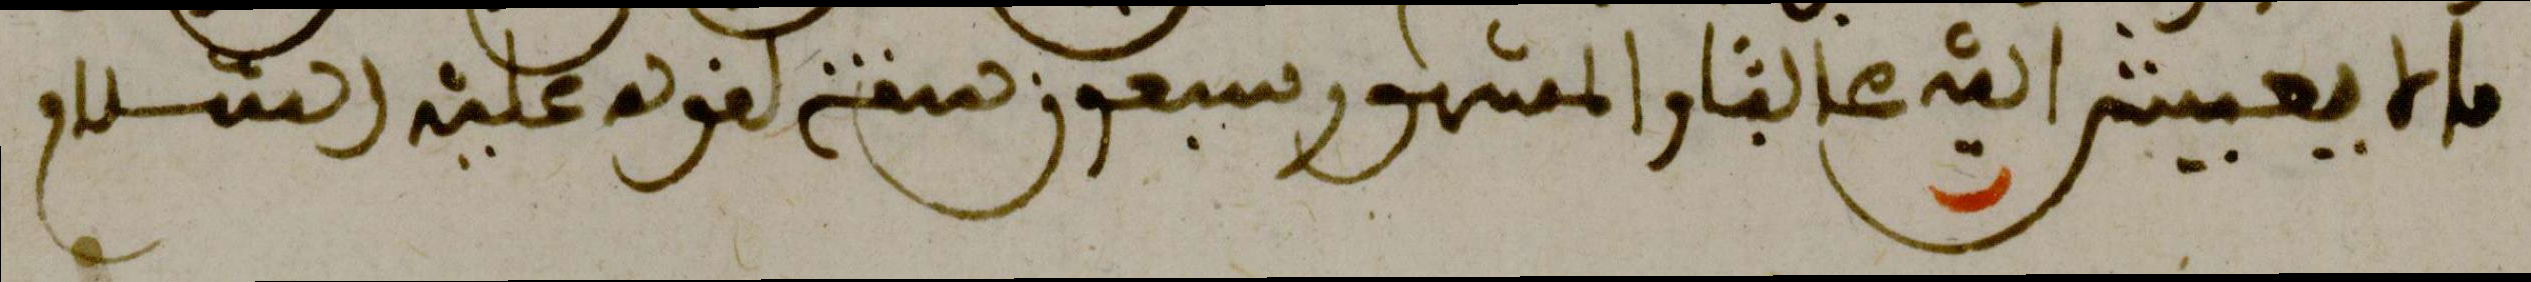ملا يعيش اليه غالبا و المشهور سبعون سنة لقوله عليه السّلام
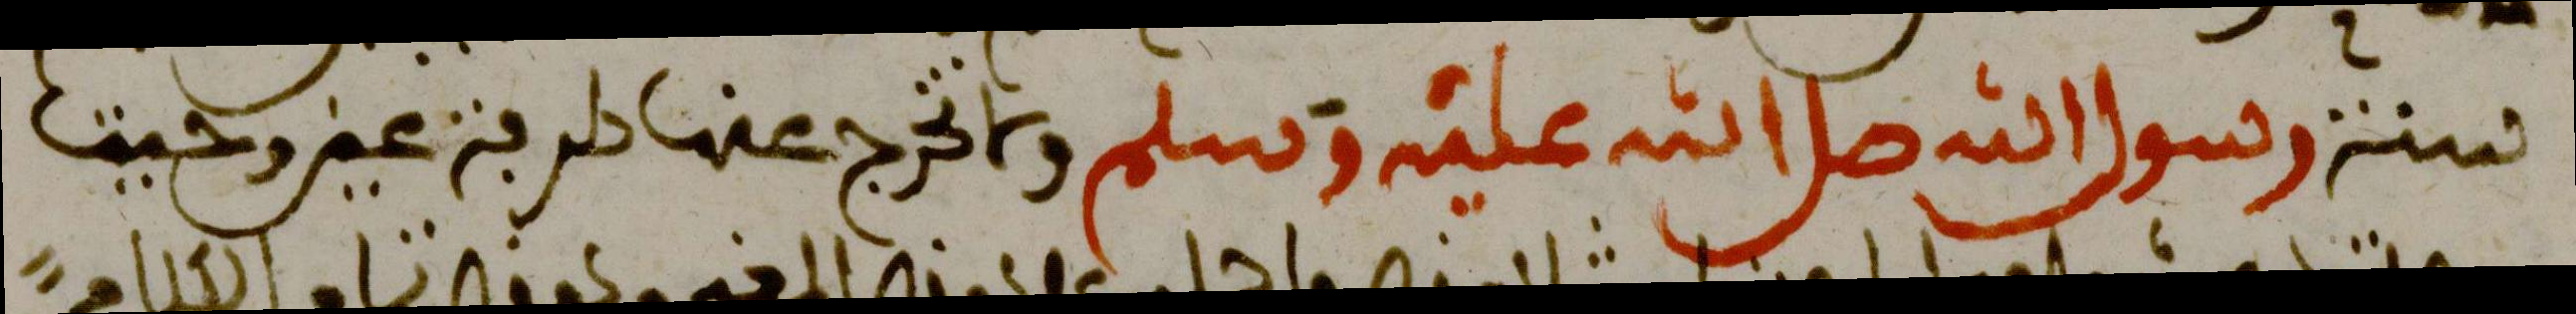سنة رسول الله صل الله عليه و سلم و لا تخرج عنها طرفة عين و حيت
